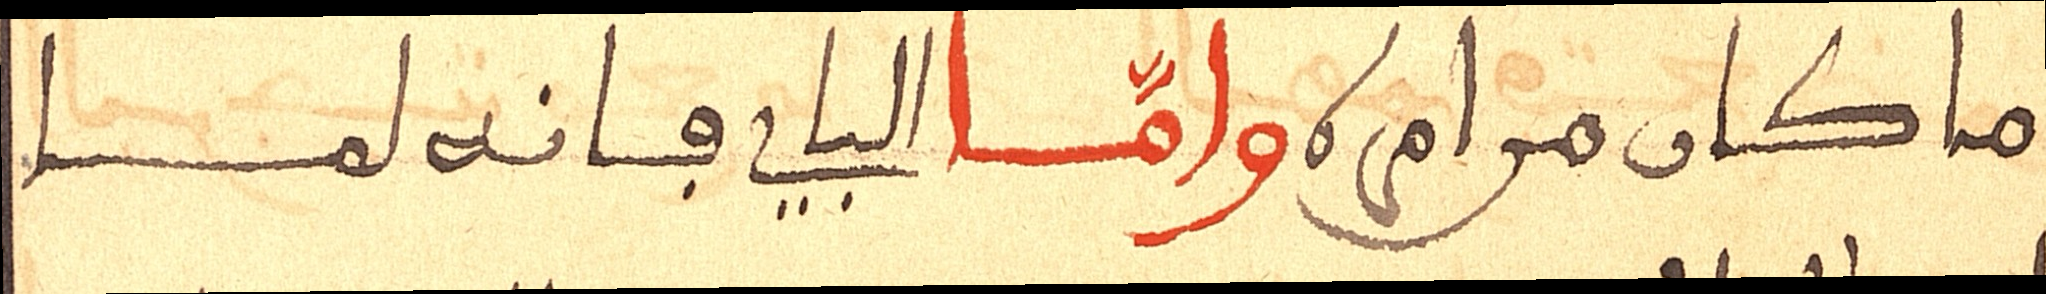ما كان من امره واما الباي فانه لما
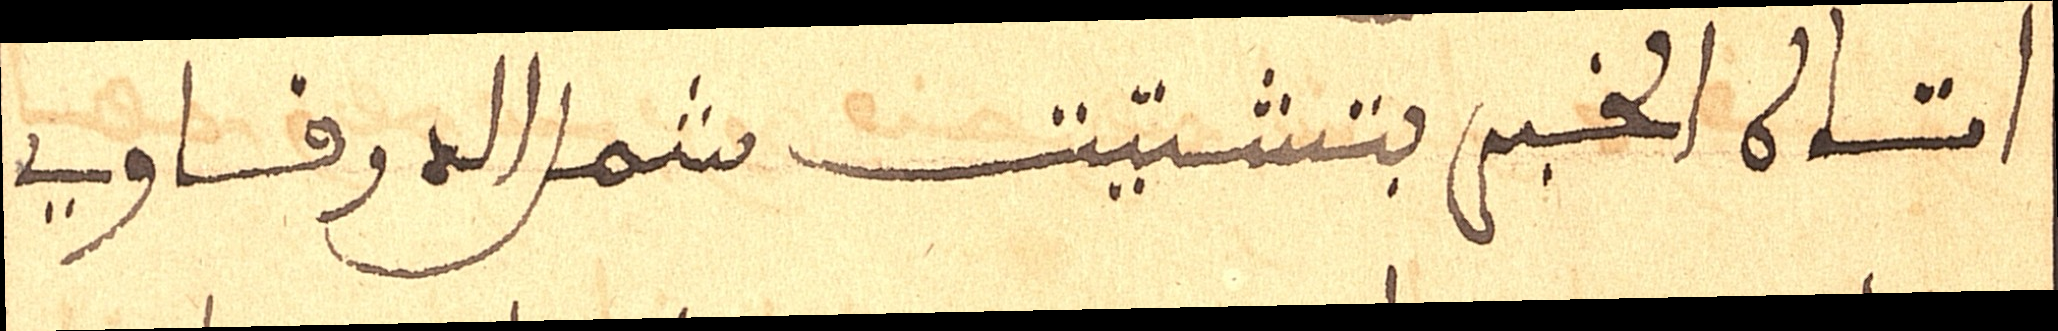اتاه الخبر بتشتيت شمل الدرقاوي
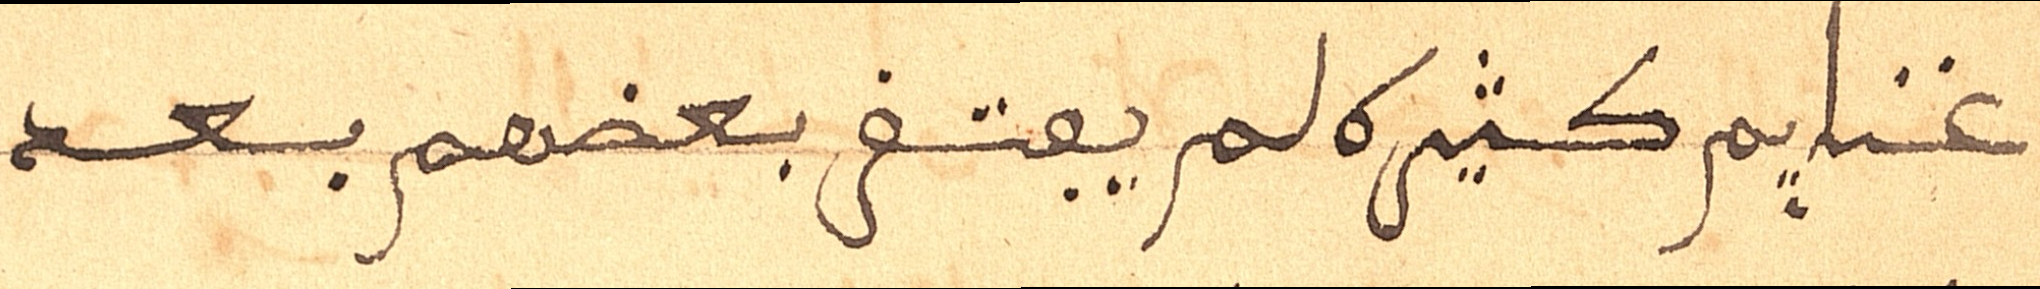غنائم كثيره لم يفتقر بعضهم بعد
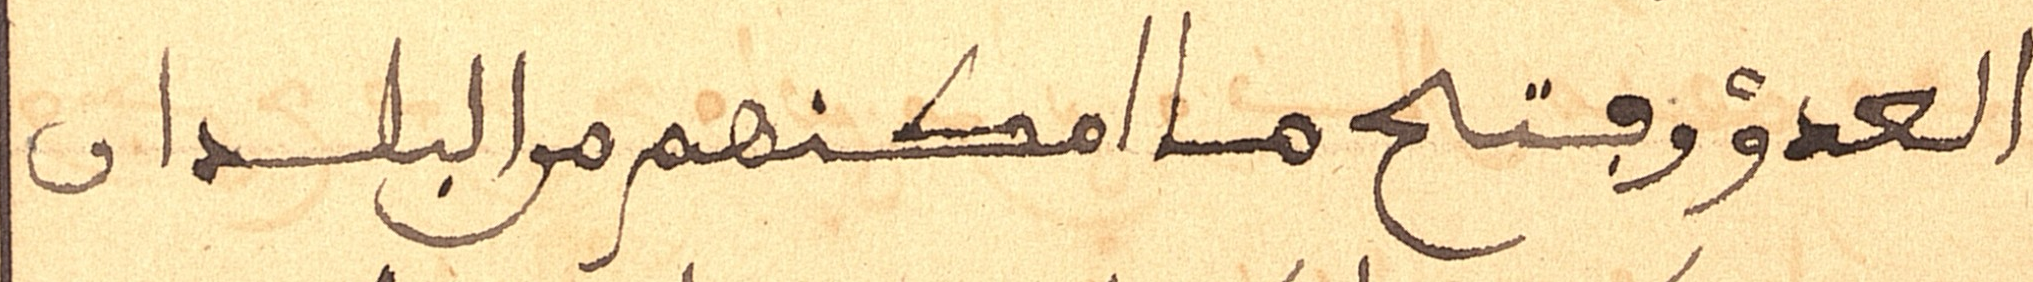العدو وفتح ما امكنهم من البلدان
